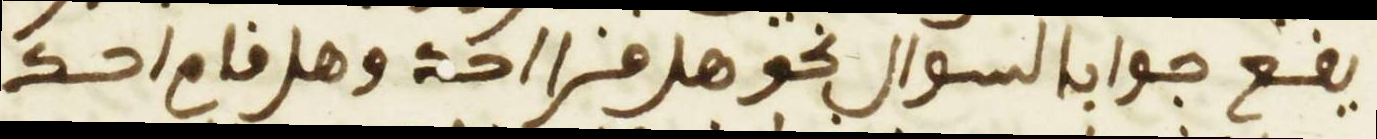يقع جوابا بالسوال نحو هل قرا احد و هل قام احد
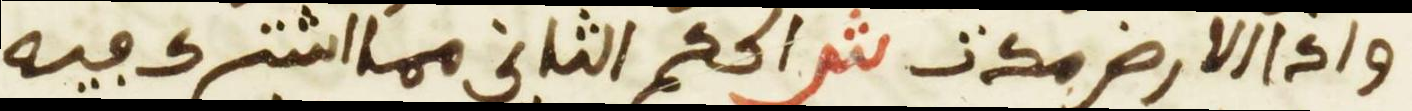و اذا الارض مدت ش الحكم الثاني مما اشترك فيه
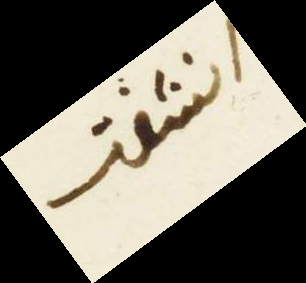انشقت
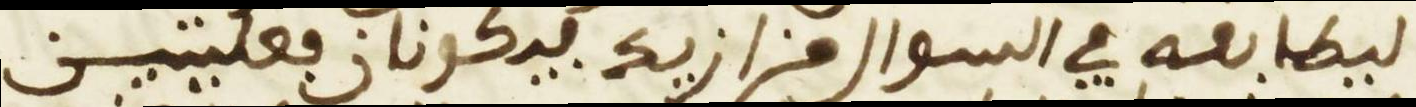ليطابقه في السوال قرا زيد بيكونان فعليتين
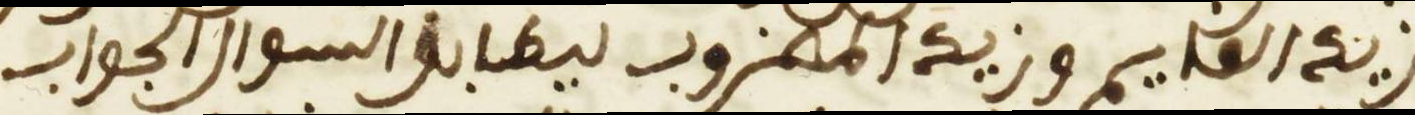زيد القايم و زيد المضروب ليطابل السوال الجواب
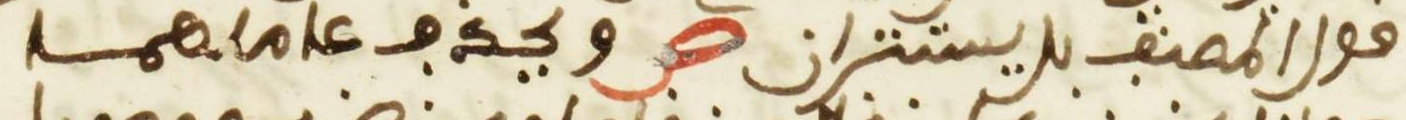قول المصنف بل يستتران ص و يحذف عاملهما
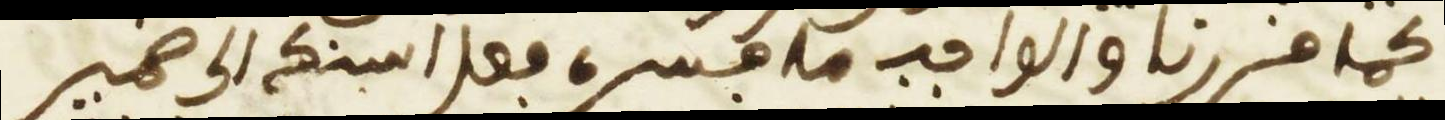كما قررنا و الواجب ما فسره فعل اسند الى ضمير
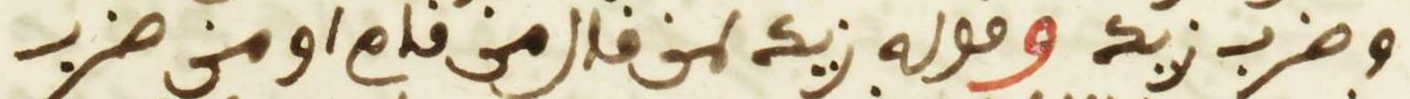و ضرب زيد و قوله زيد لمن قال من قام او من ضرب
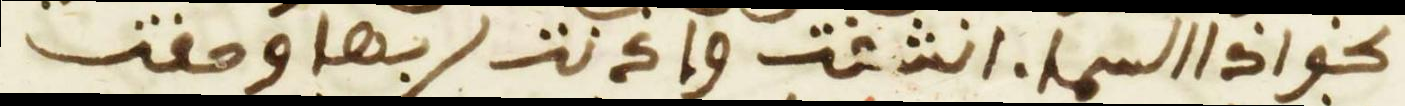نحو اذا السماء انشقت و اذنت ربها و حقت
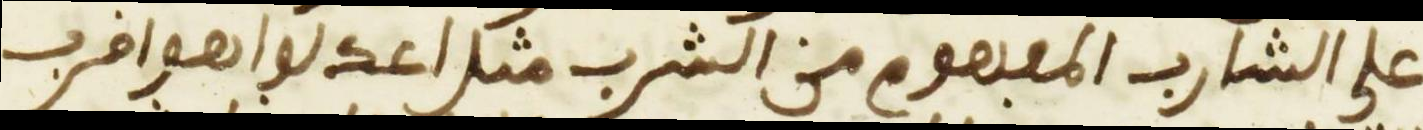على الشارب المفهوم من الشرب مثل اعدلوا هو اقرب
